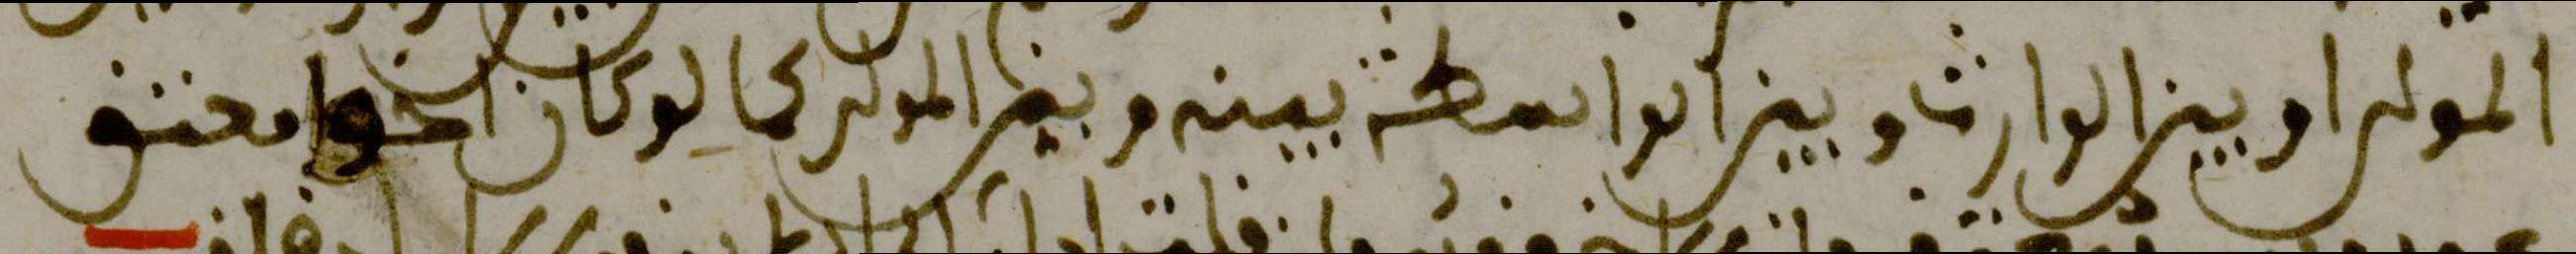المولى او بين الوارث وبين الواسطة بينه وبين المولى كما لو كان اجوا معتق
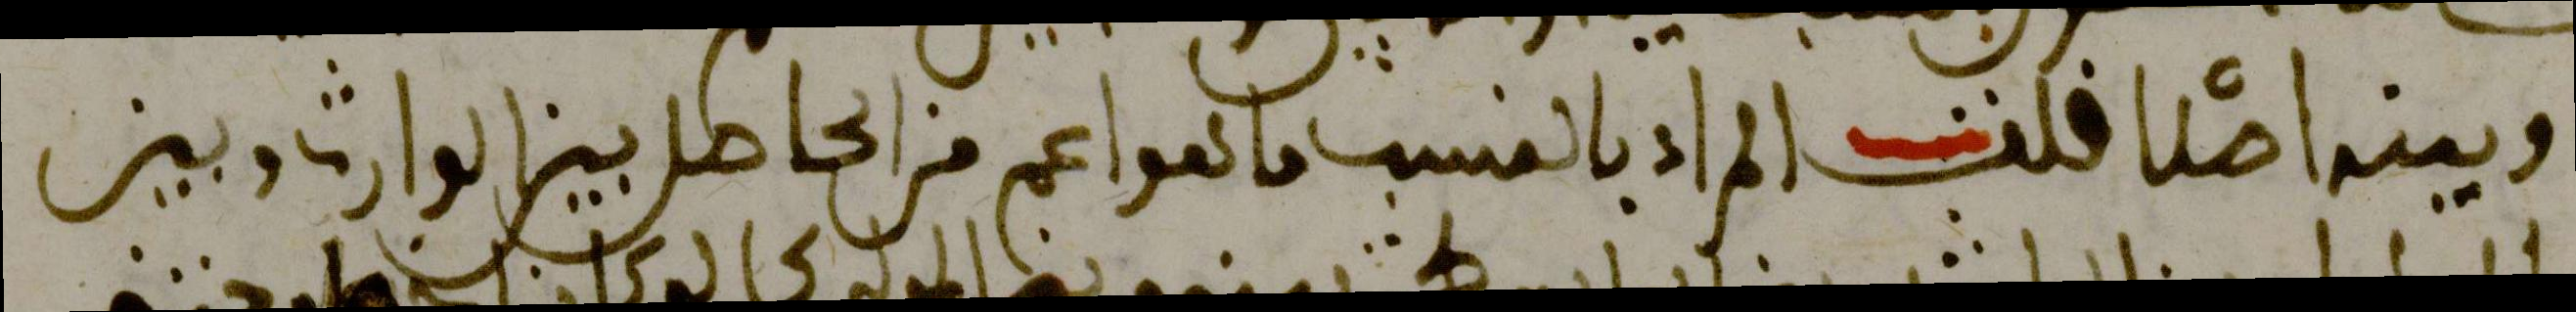ويبنه اصلا قلت المراد بالنسب ما هو اعم من الحاصل بين الوارث وبين
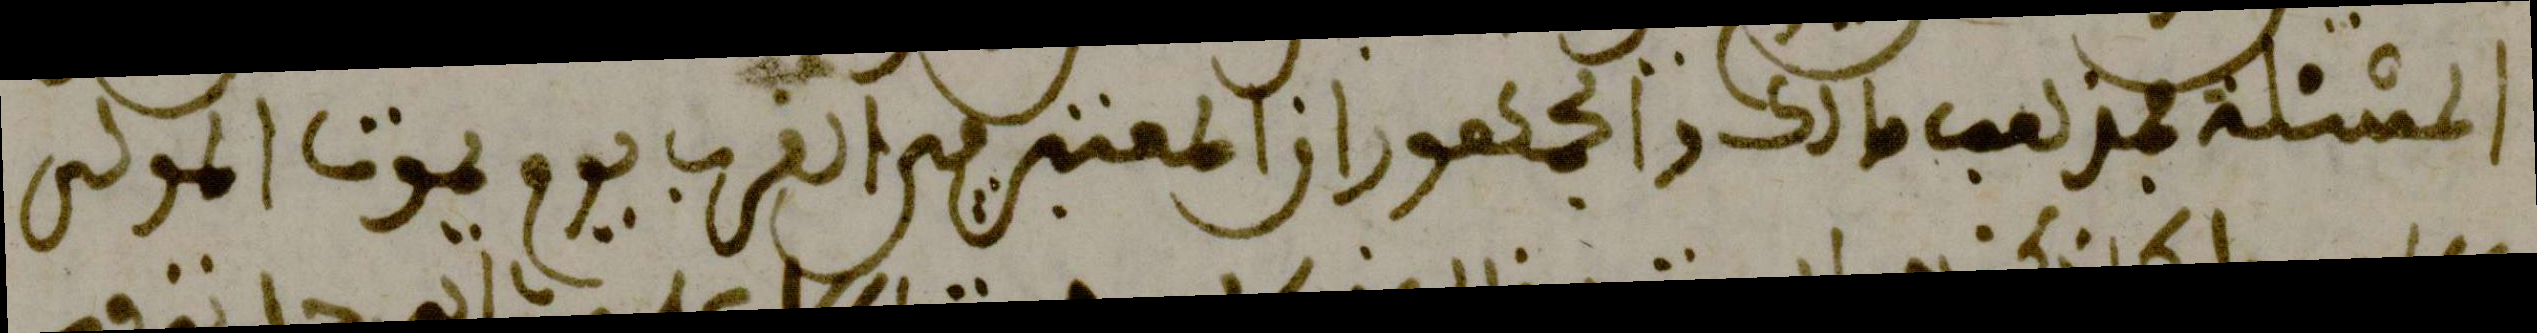المسئلة فمذهب مالك والجمهور ان المعتبر في القرب يوم يموت المولى
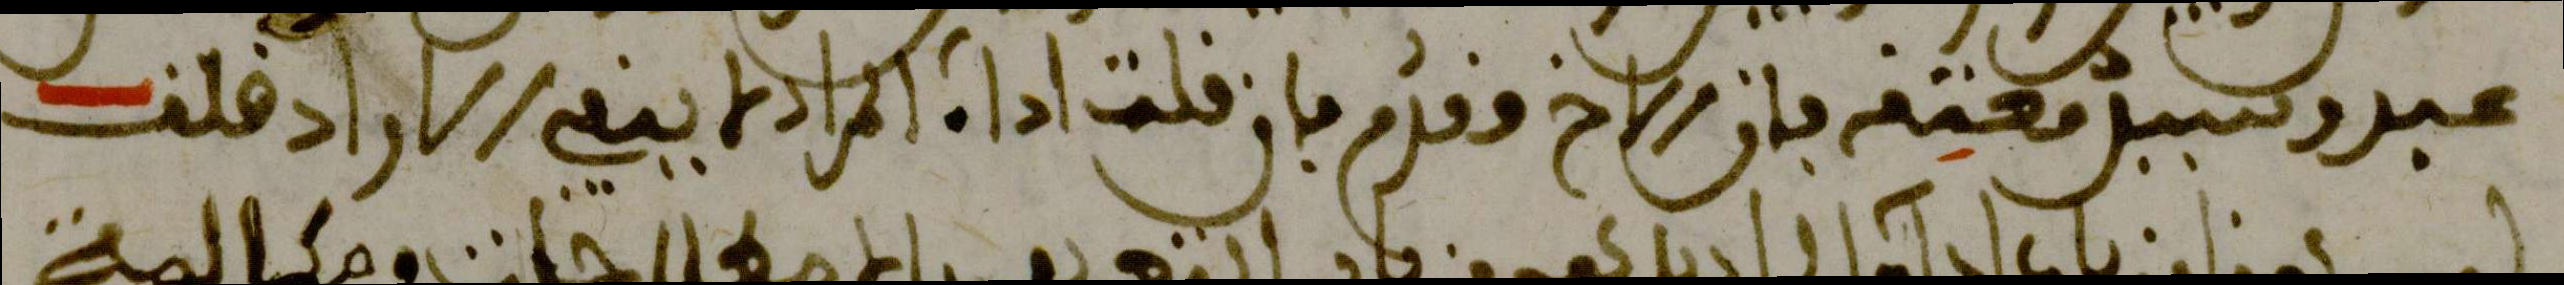عبد وسيد معتقه فان الاخ مقدم فان قلت اداء المراد لا ينفي الاراد قلت
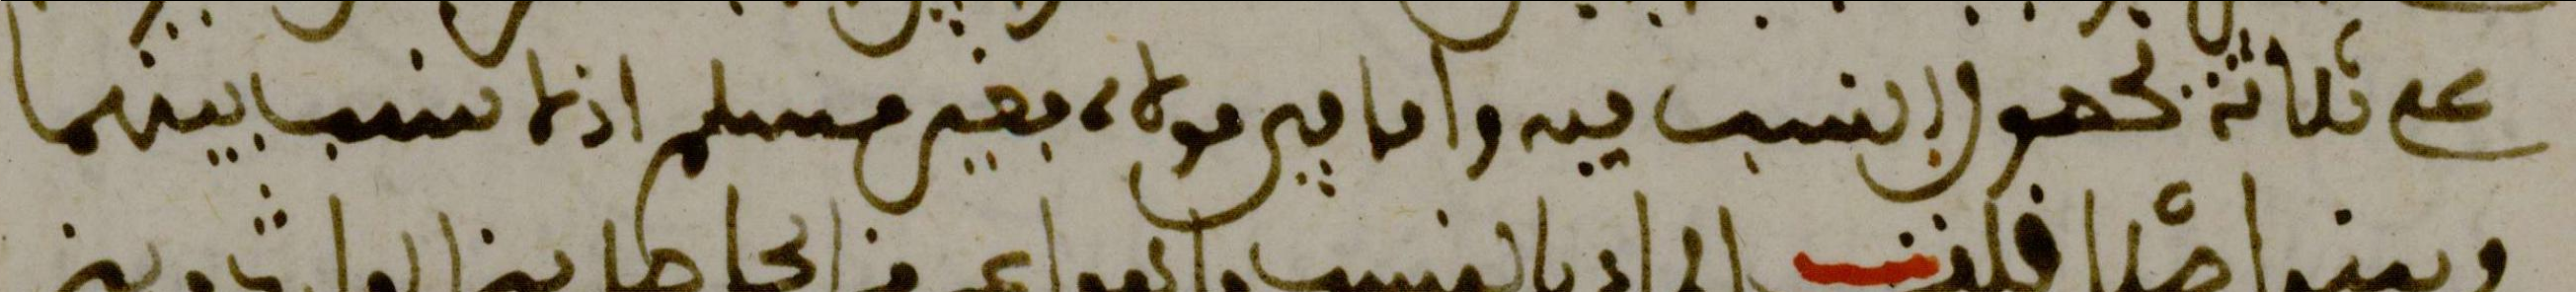على ثلاثة لحصول النسب فيه واما في مولاه فغير مسلم اذ لا نسب بينهما
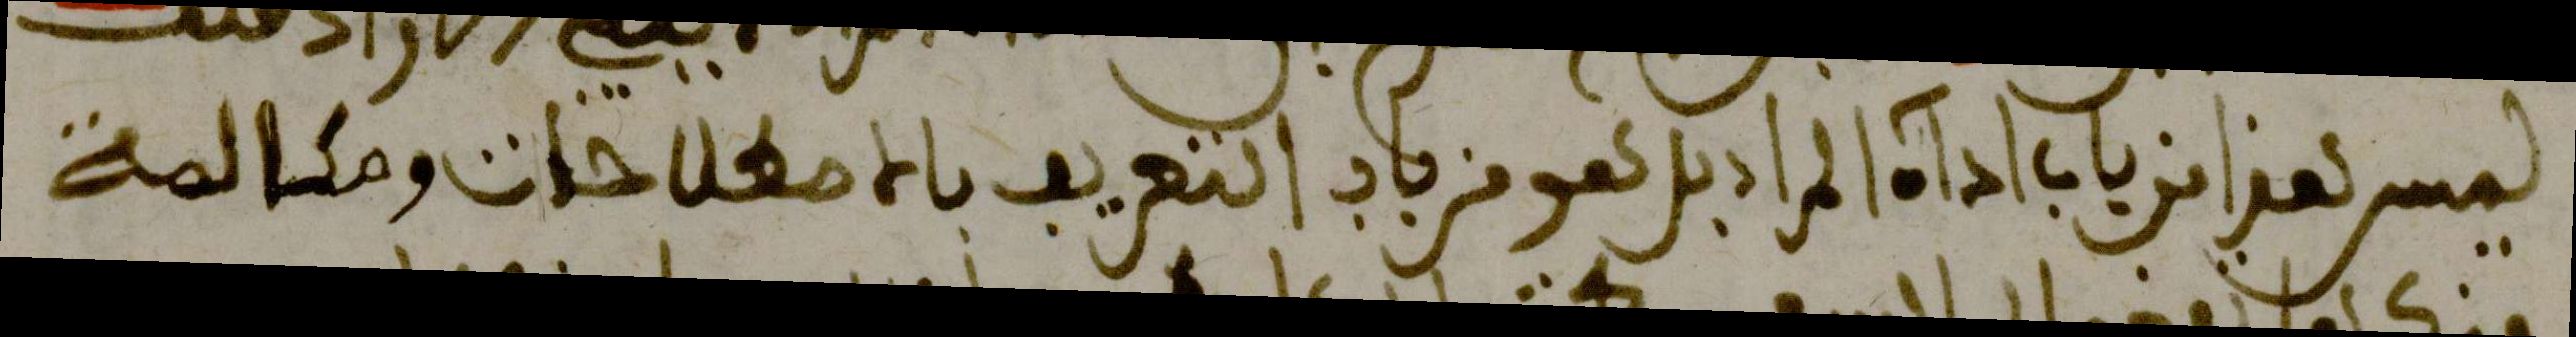ليس هذا من باب اداء المراد بل هو من باب التعريف بالاصطلاحات ومكالمة
